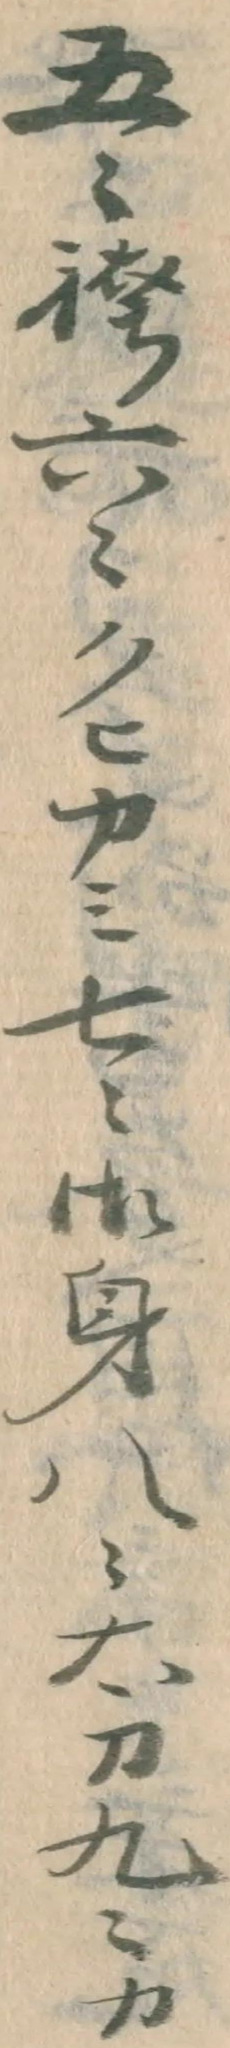五々袴六々クヒカミ七々御身八々太刀九々カ
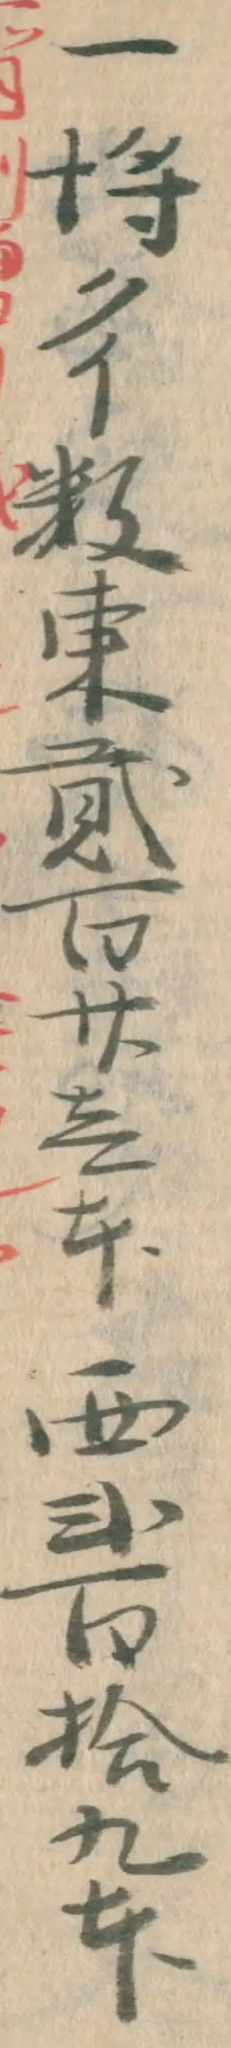一埒クイ数東弐百廿壱本西弐百拾九本
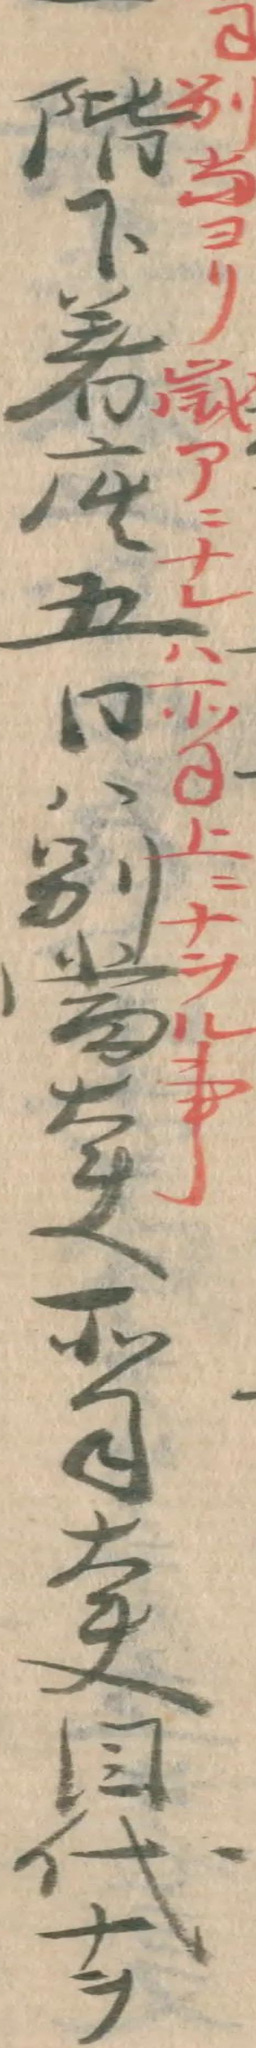一階下着座五日ハ別当大夫所司大夫目代ナヲ
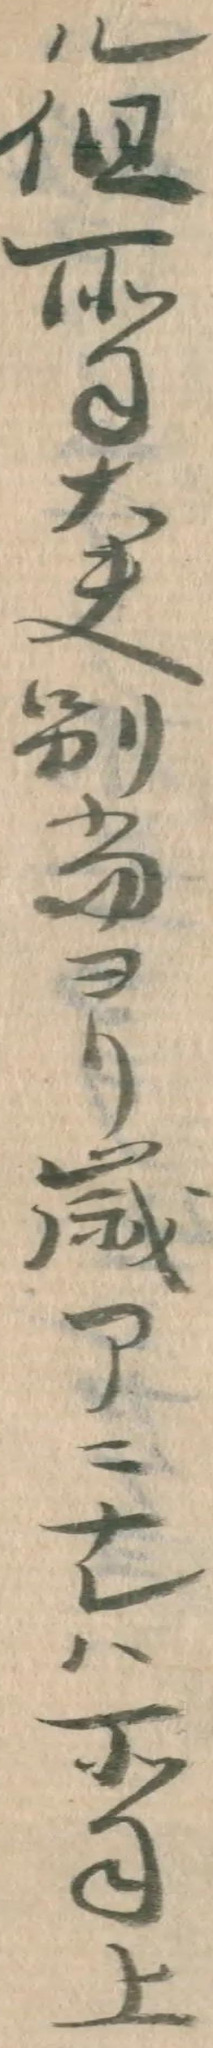ル但所司大夫別当ヨリ歳アニナレハ所司上
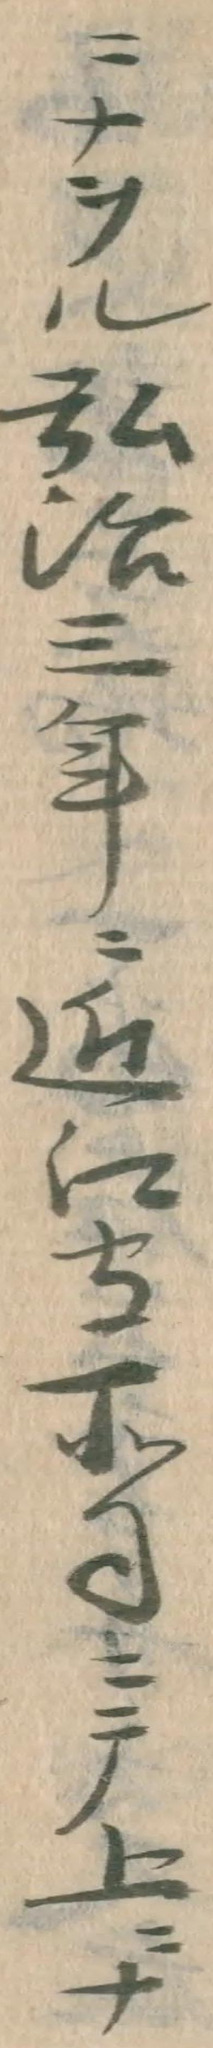ニナヲル弘治三年ニ近江守所司ニテ上ニナ
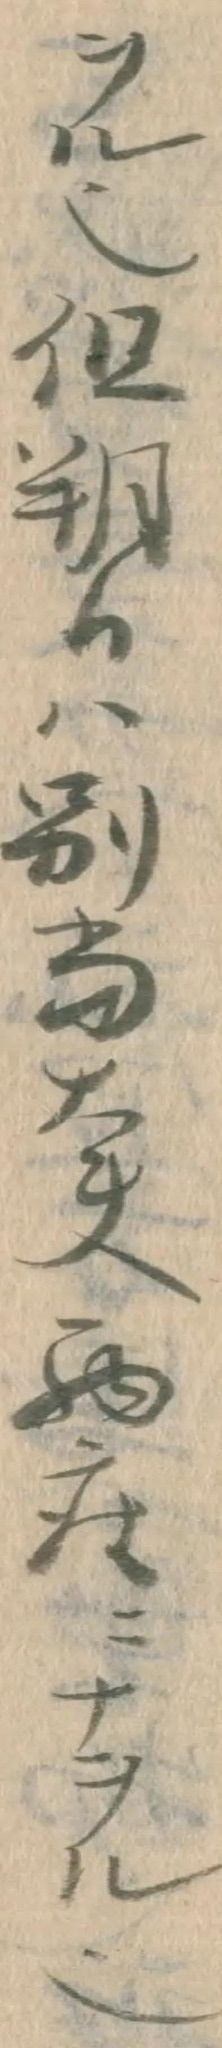ヲル也但朔日ハ別当大夫西座ニナヲル也
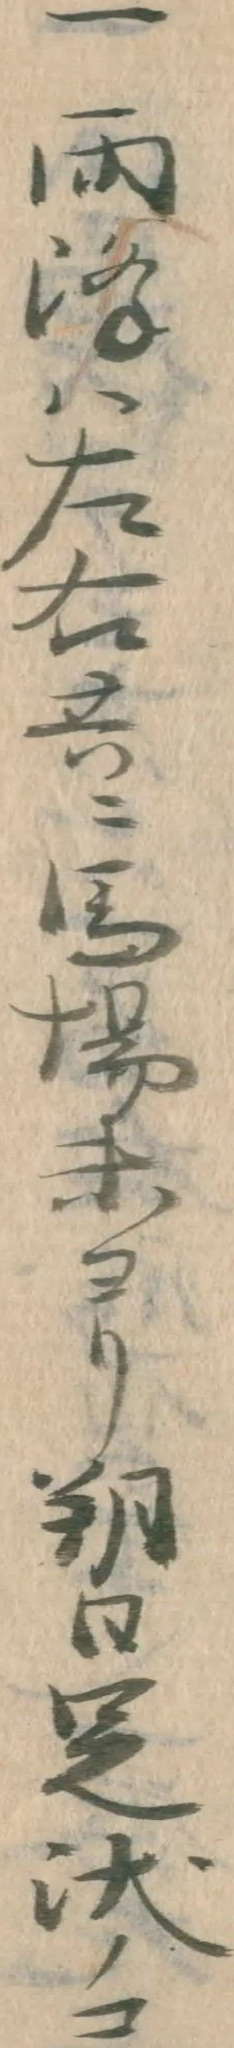一雨降ハ左右共ニ馬場未ヨリ朔日足汰ノコ
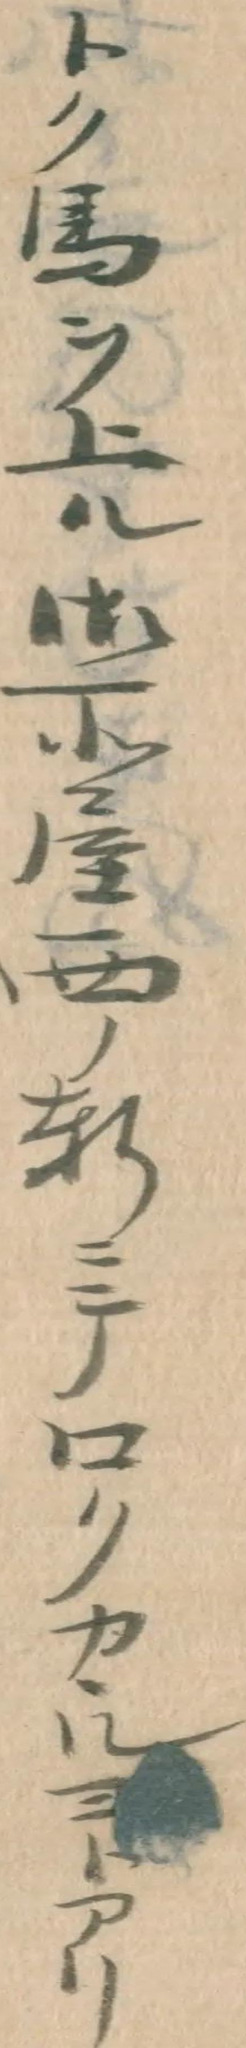トク馬ヲ上ル御所屋西ノ軒ニテロクカヽルヨトアリ
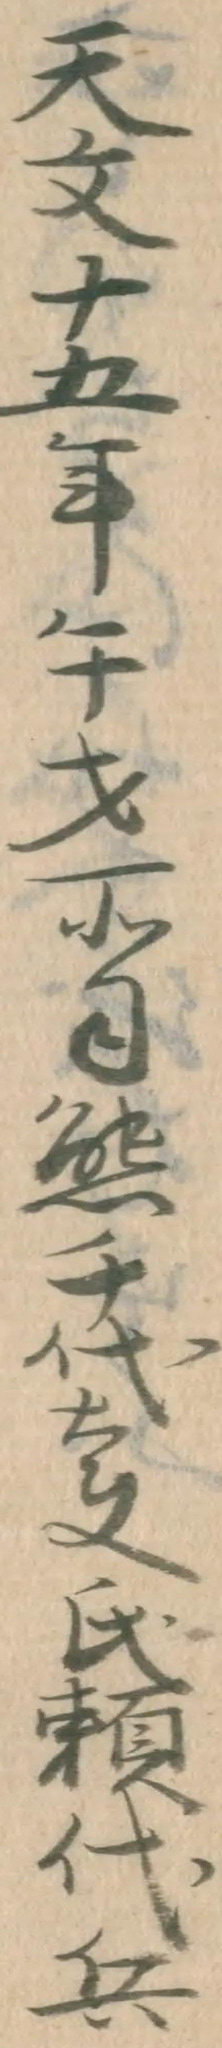天文十五年午才所司熊千代大夫氏頼代兵
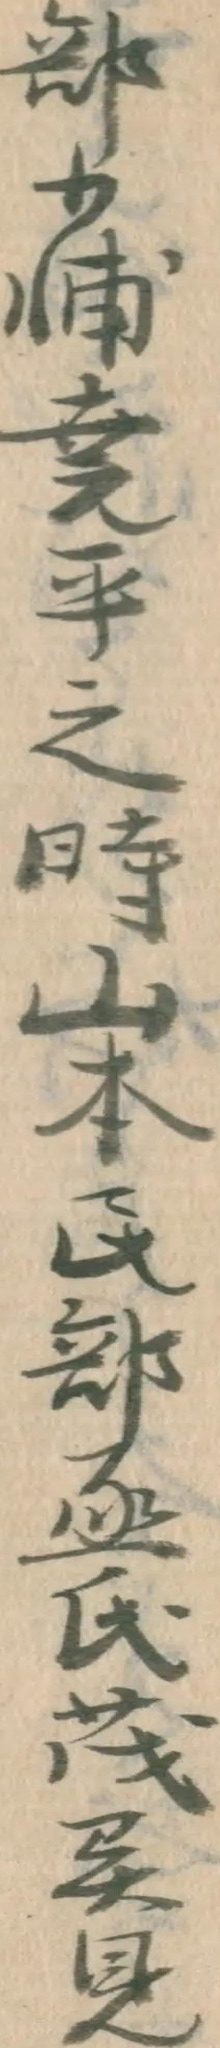部少輔堯平之時山本民部丞氏茂異見
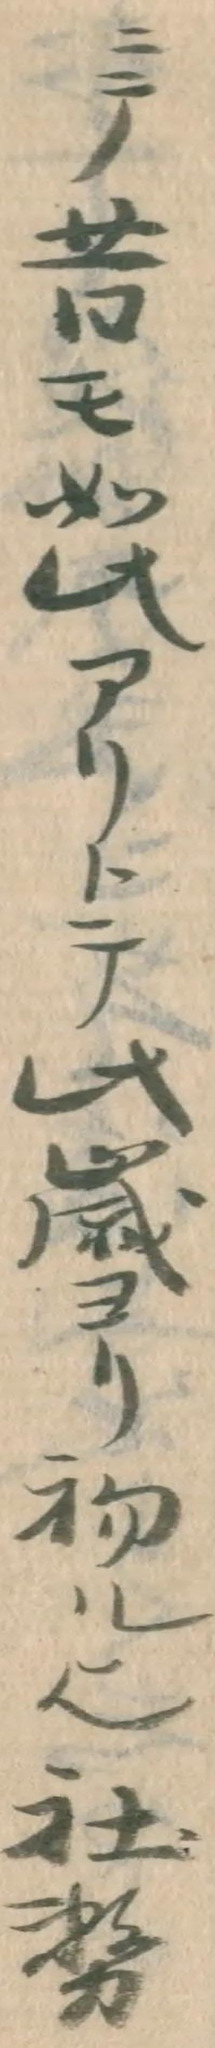ニテ昔モ如此アリトテ此歳ヨリ初ル也社務
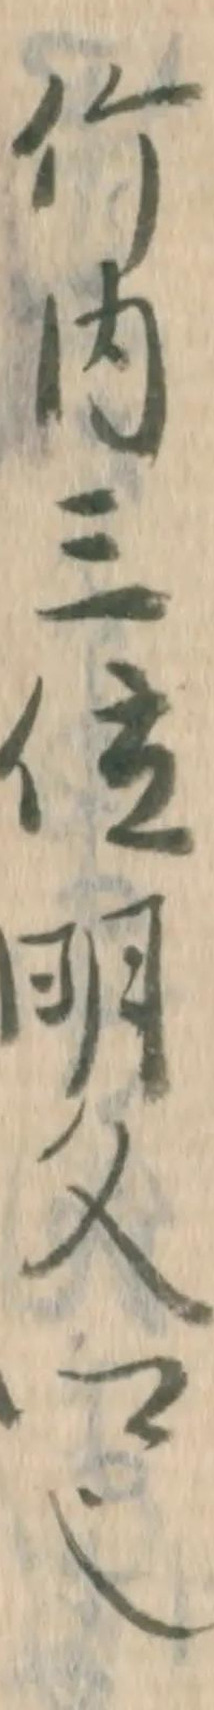竹内三位明久卿也
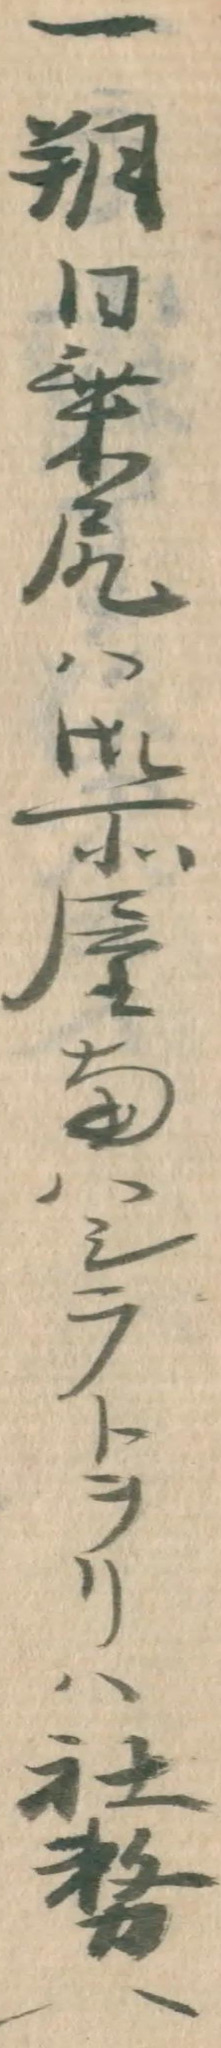一朔日乗尻ハ御所屋南ハシラトヲリハ社務へ
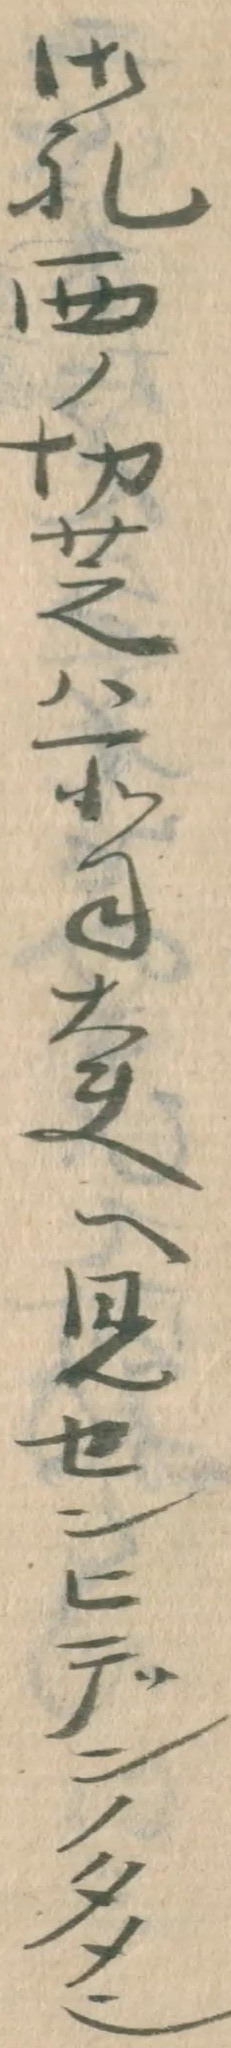御礼西ノ切芝ハ所司大夫へ見センヒデンノタメ也
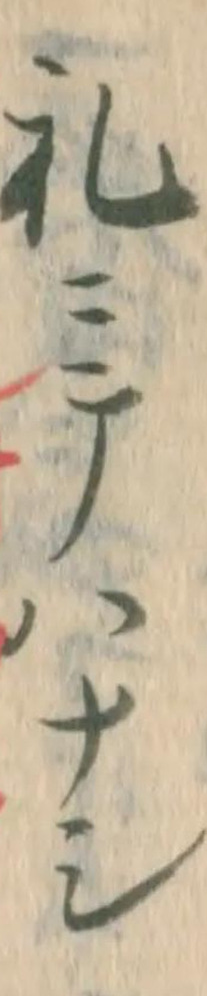礼ニテハナシ
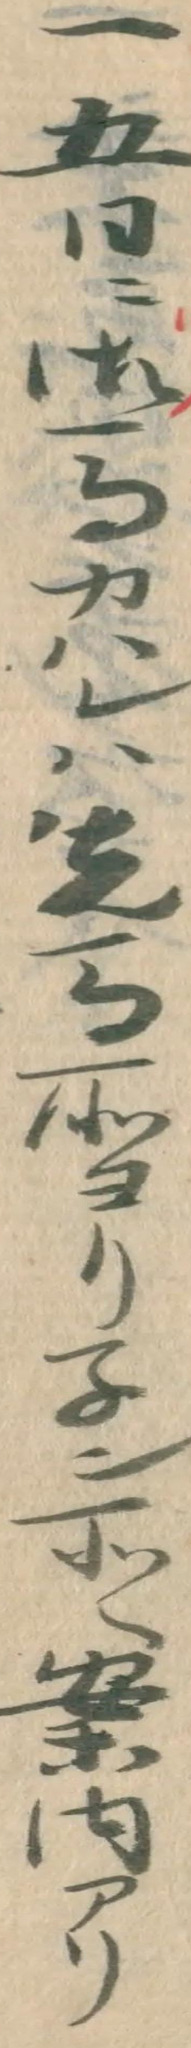一五日ニ御馬カハレハ先馬所ヨリ子ン所へ案内アリ
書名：賀茂社記録. 第10冊
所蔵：国立国会図書館 National Diet Library, JAPAN
